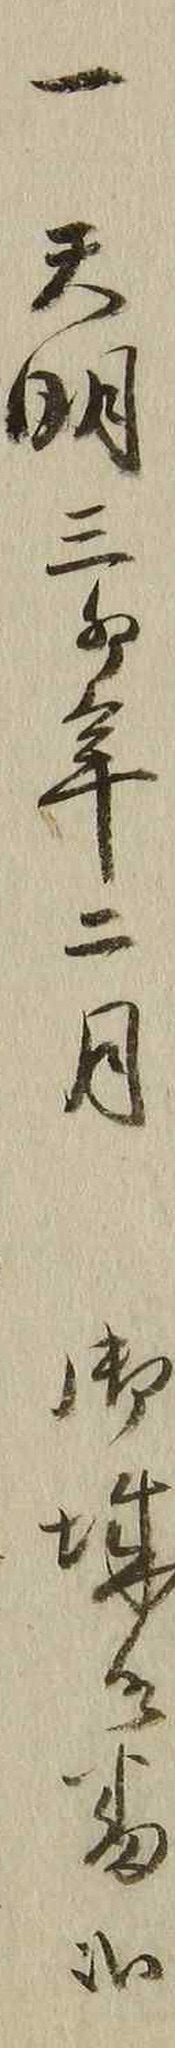一天明三卯年二月御城御番弐
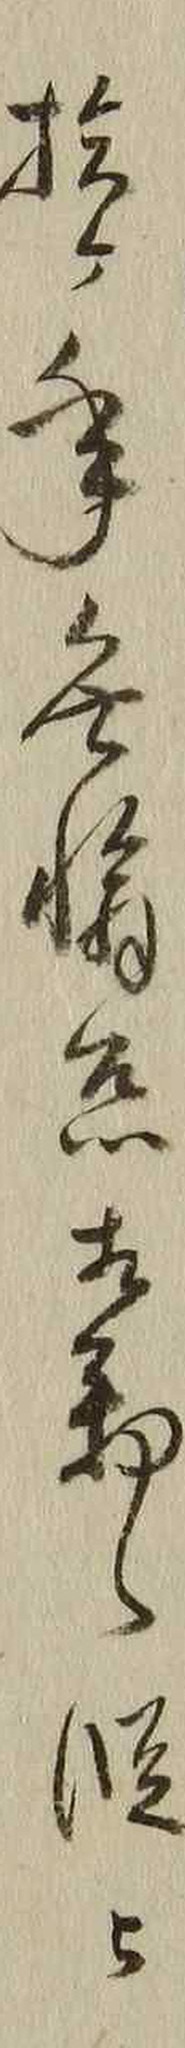拾ヶ年無懈怠相勤候段被
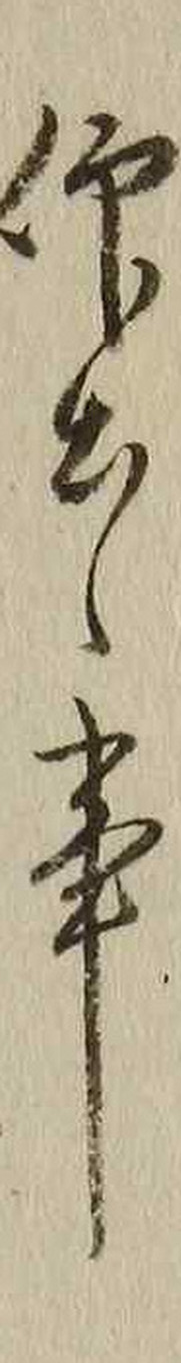仰出候事
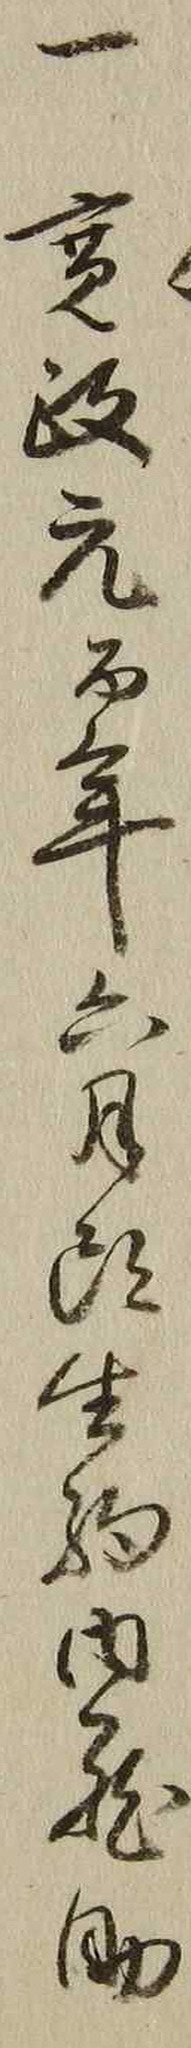一寛政元酉年六月頭生駒内蔵助
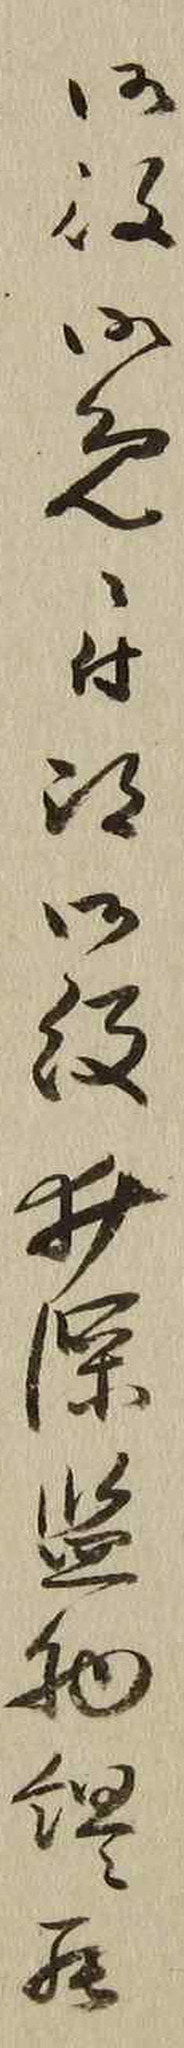御役御免ニ付跡御役井深監物組ニ罷
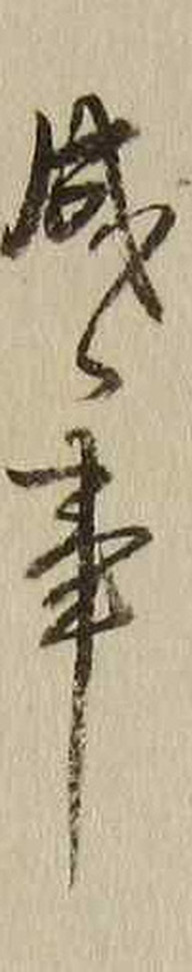成候事
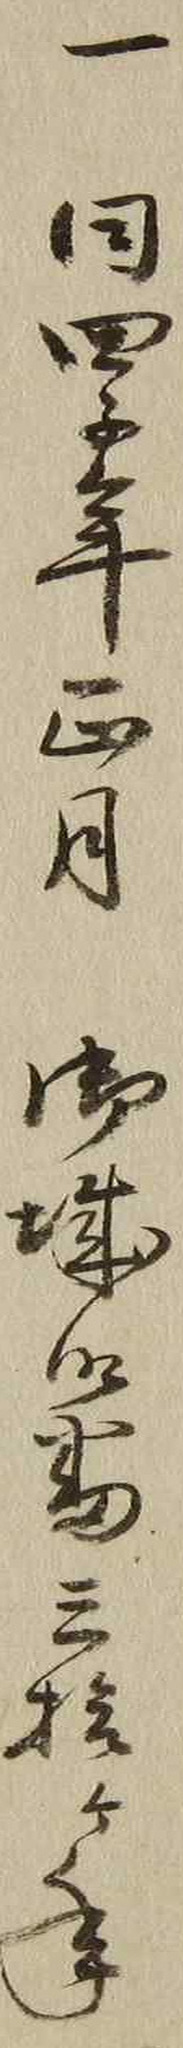一同四子年正月御城御番三拾ヶ年
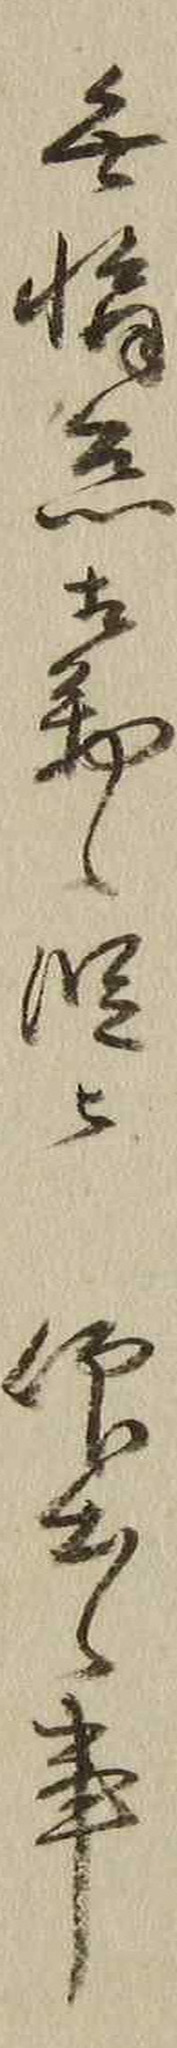無懈怠相勤候段被仰出候事
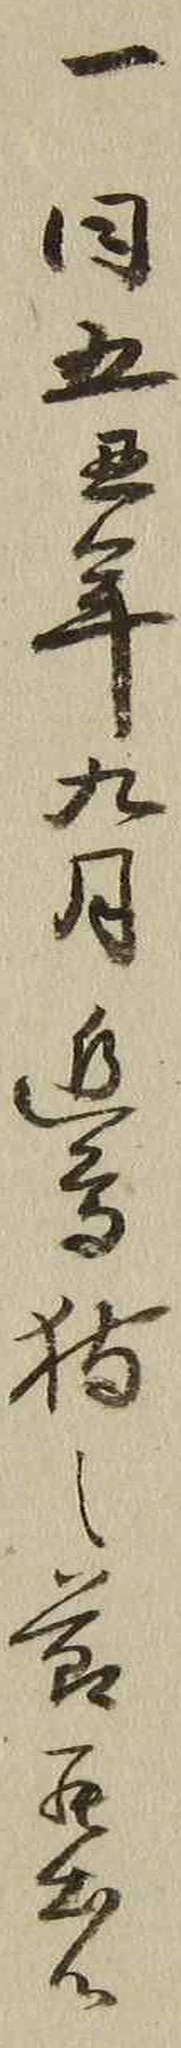一同五丑年九月追鳥狩之節罷出候
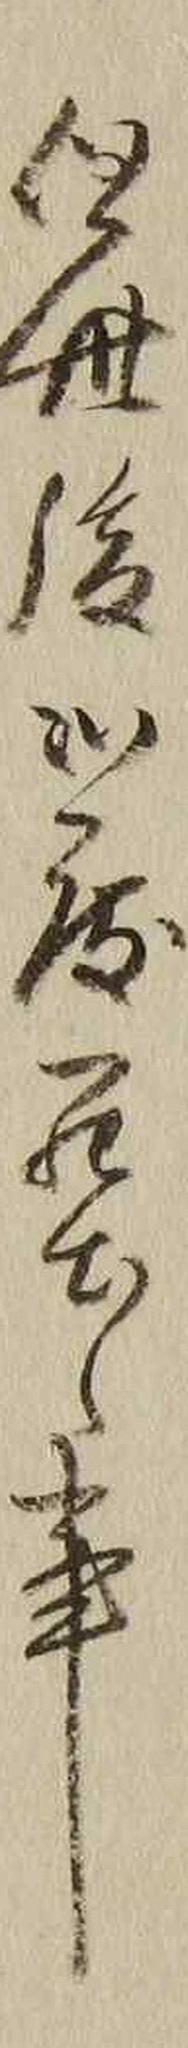但此後弐度罷出候事
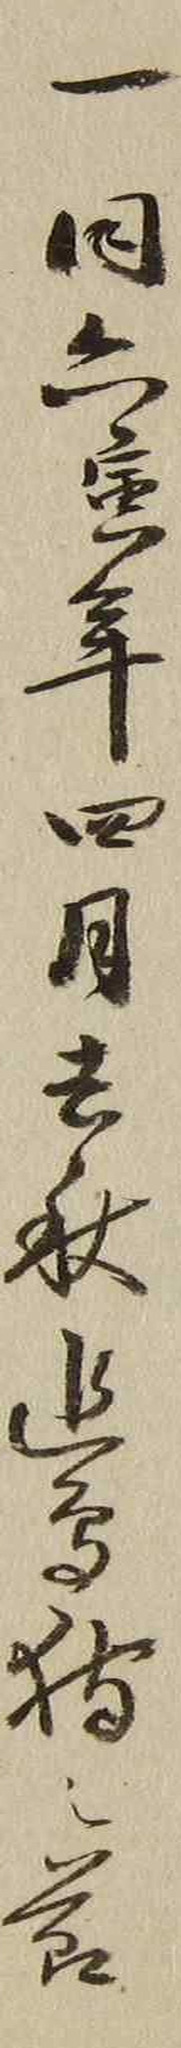一同六寅年四月去秋追鳥狩之節
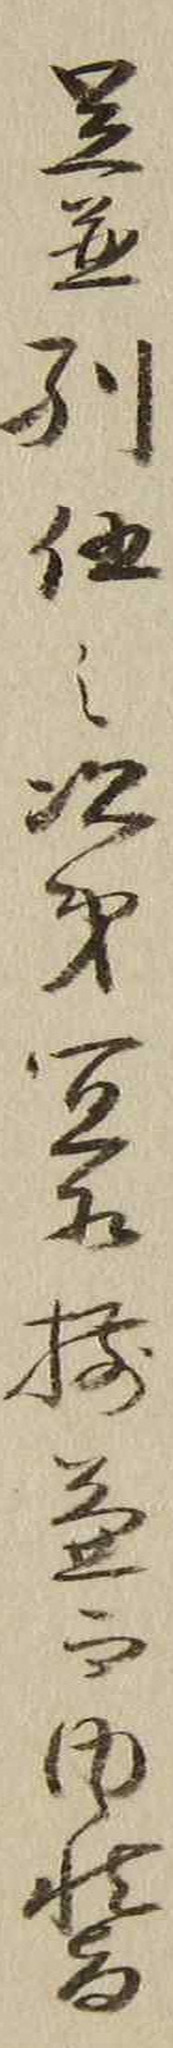足並列伍之次第宜相揃兼而内稽
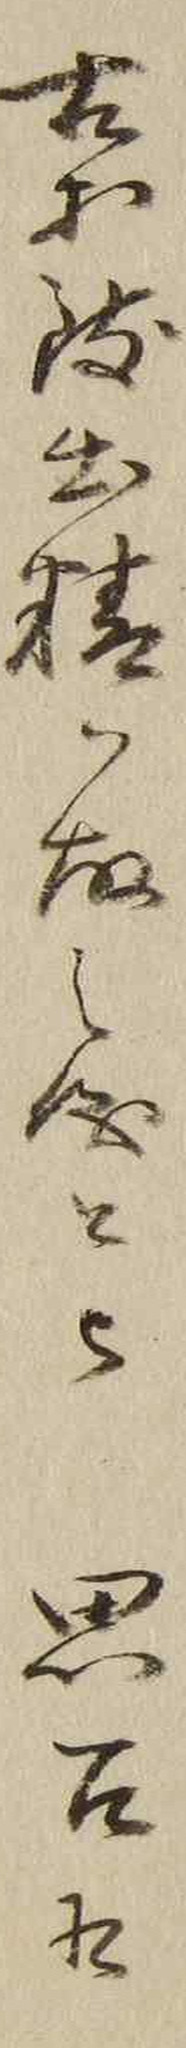古等致出精候故之儀と被思召候
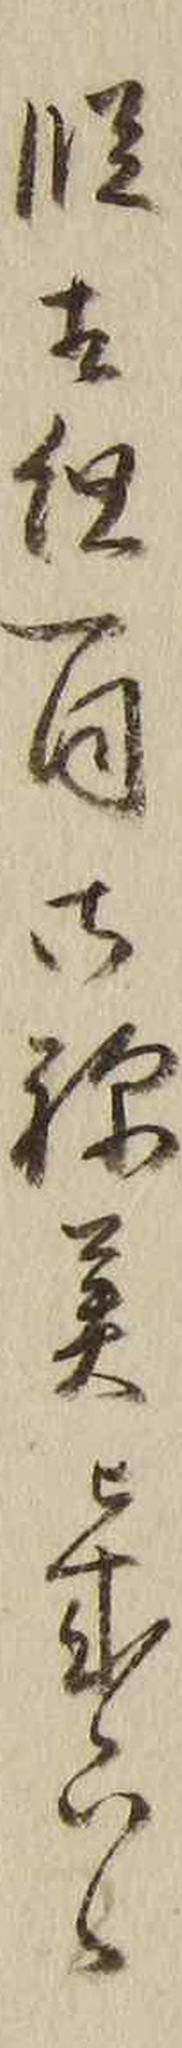段相組一同御称美被成下候

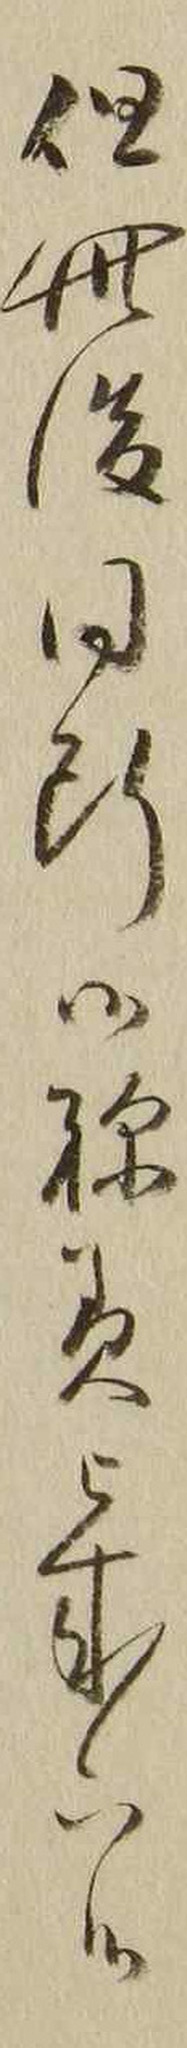但此後同断御称美被成下候
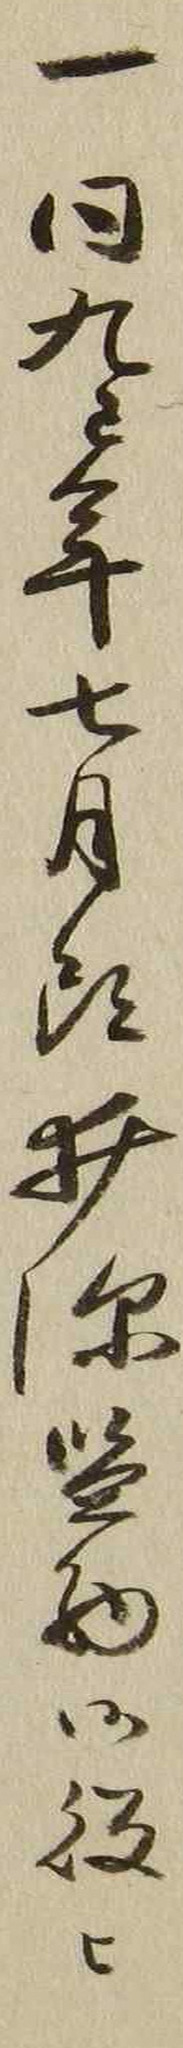一同九巳年七月頭井深監物御役被
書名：諸士系譜　巻之236　ふ之部4
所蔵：会津若松市立会津図書館
